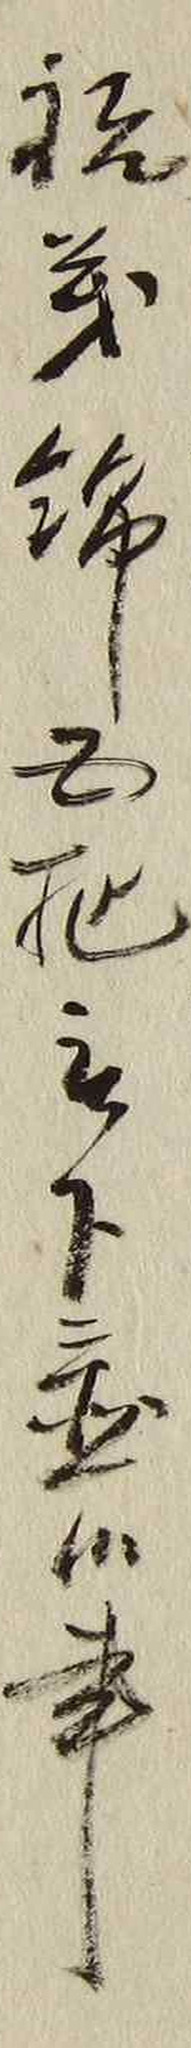祝義綿五把被下置候事
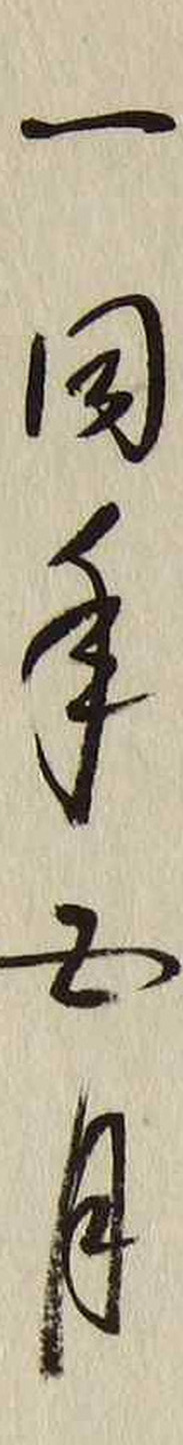一同年五月
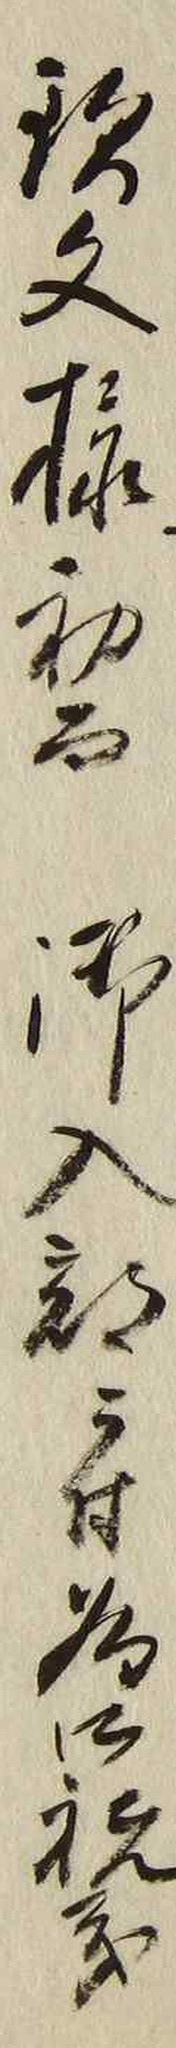欽文様初而御入部ニ付為御祝義

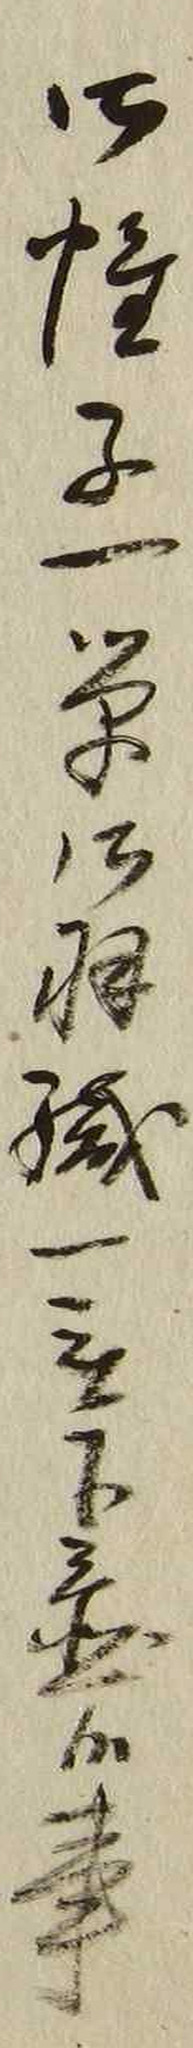御帷子一単御羽職一被下置候事
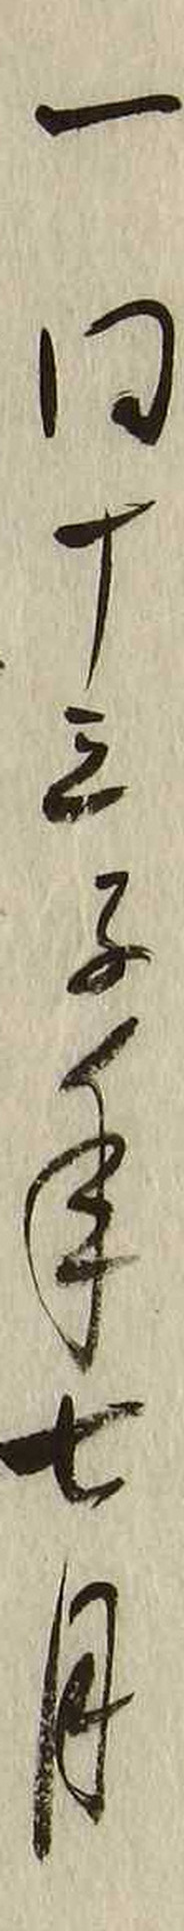一同十三子年七月
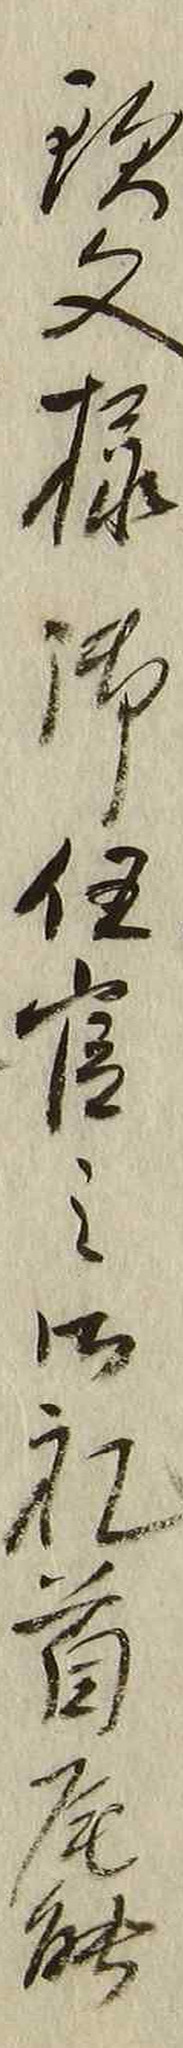欽文様御任官之御礼首尾能
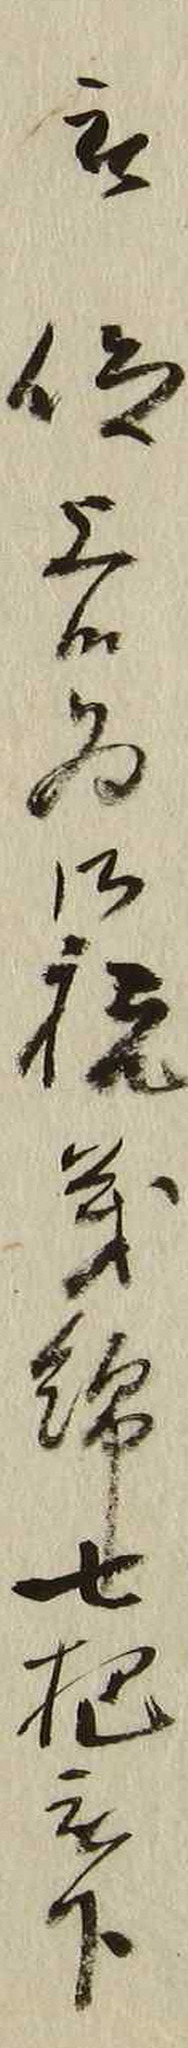被仰上候為御祝義綿七把被下
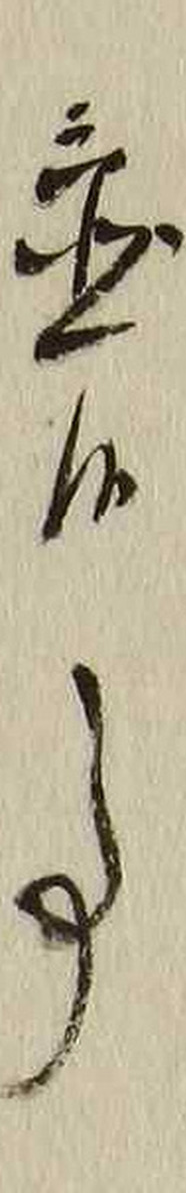置候事
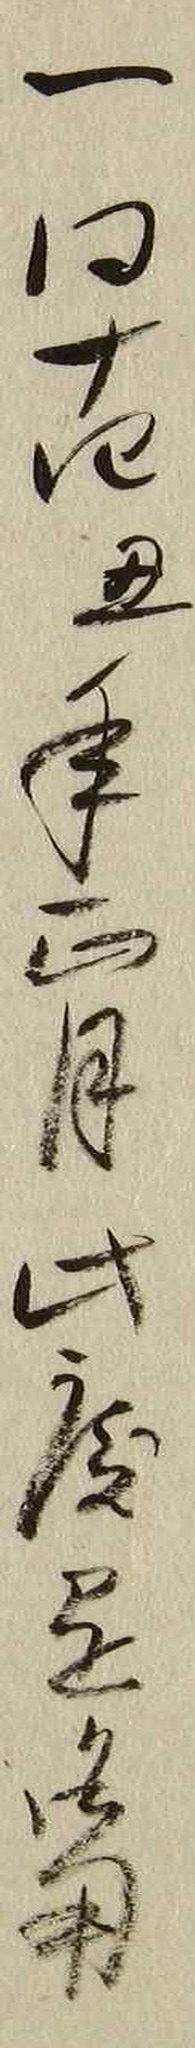一同十四丑年正月此度懸り御用
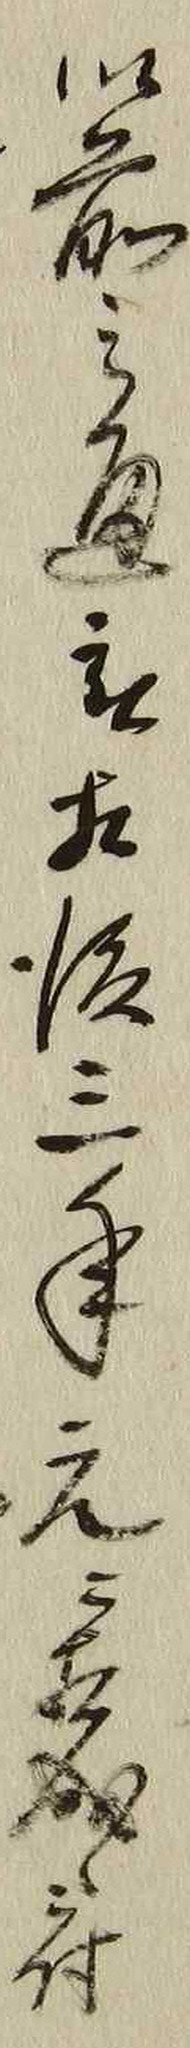以前之通被相渡三年元ニ相成候ニ付
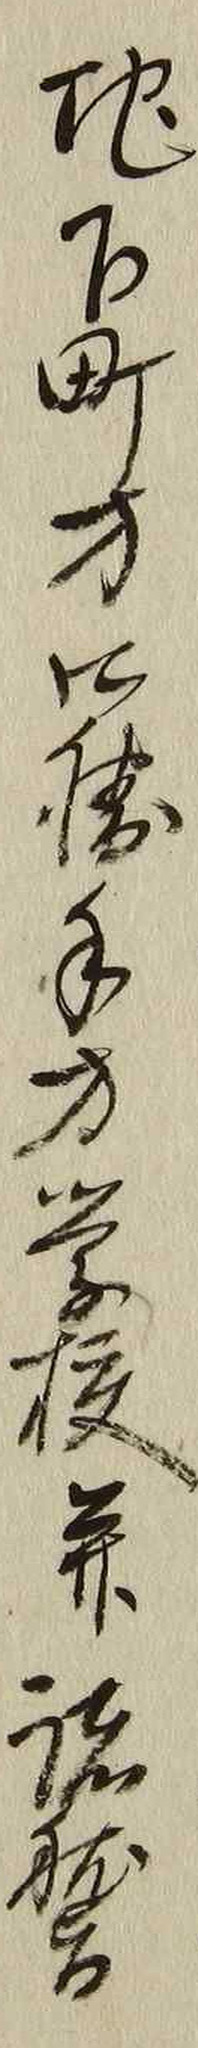地下町方御勝手方学校并諸稽
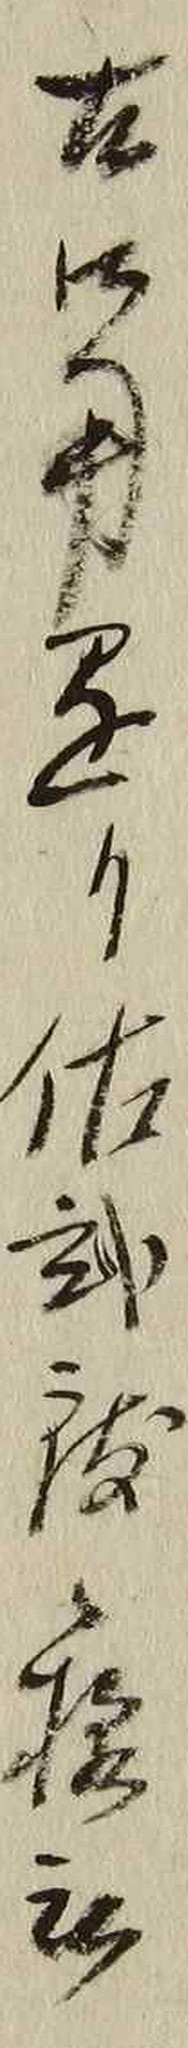古御用懸り佐弐致候様被
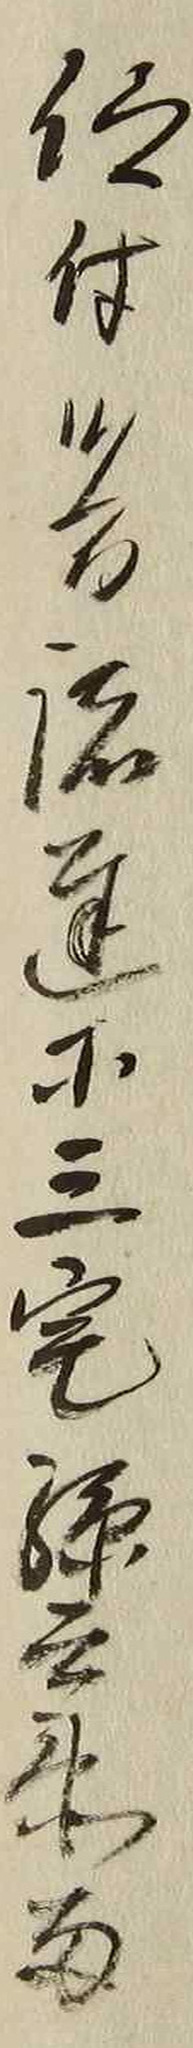仰付候間諸達等三宅孫兵衛両
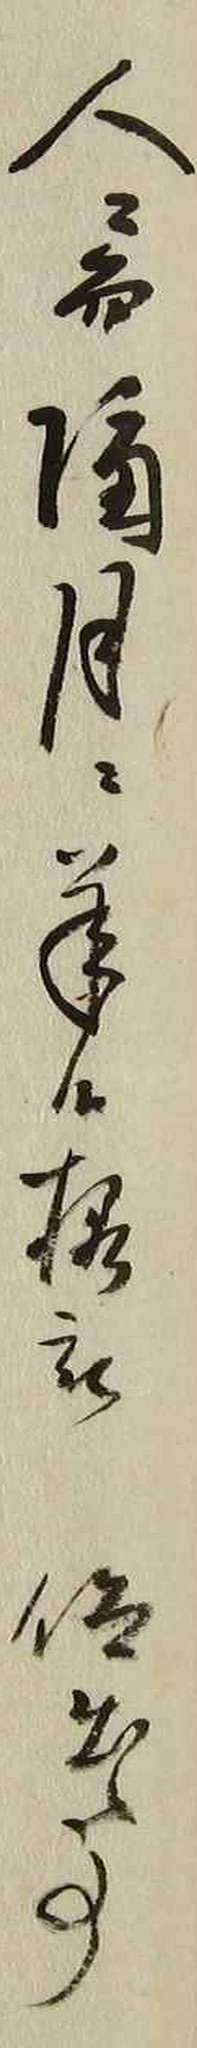人ニ而隔月ニ承候様被仰出候事
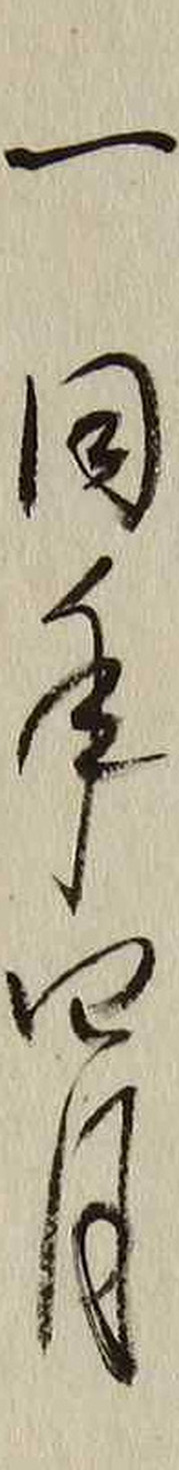一同年四月
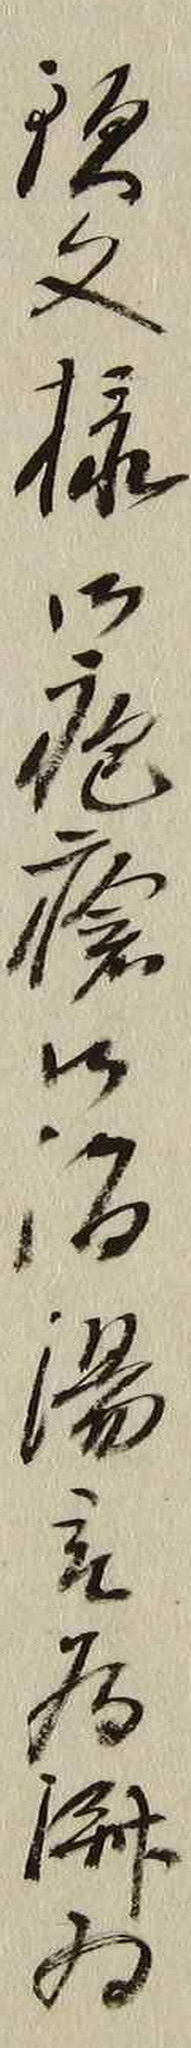欽文様御庖瘡御酒湯被為済為
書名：諸士系譜　巻之351　す之部1
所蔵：会津若松市立会津図書館
